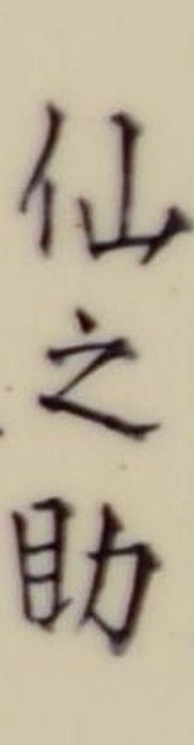仙之助
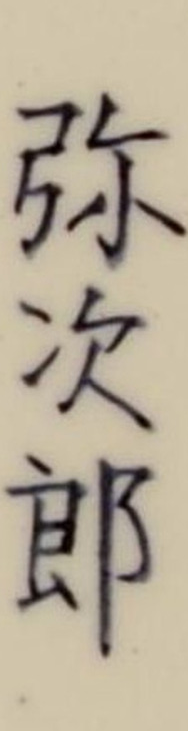弥次郎
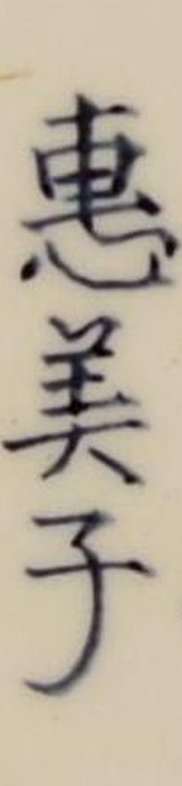恵美子
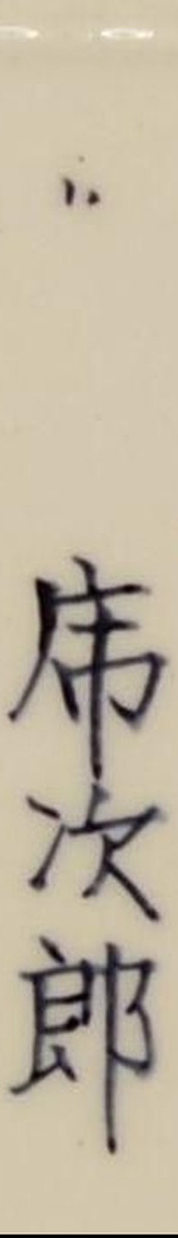弥次郎
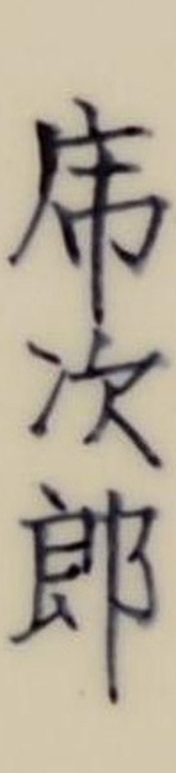弥次郎
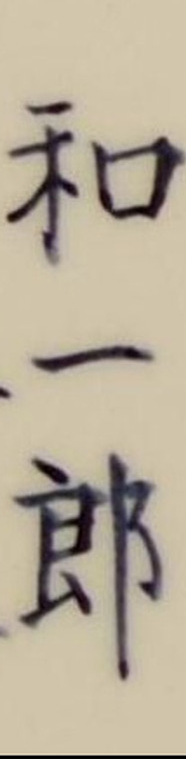和一郎
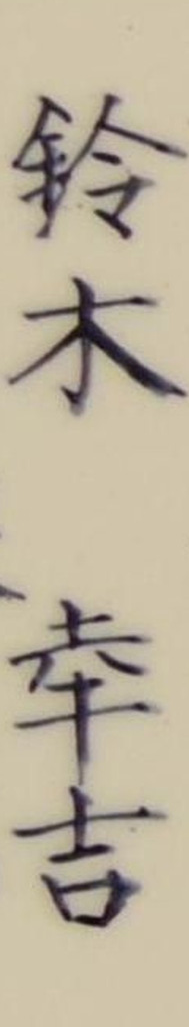鈴木幸吉
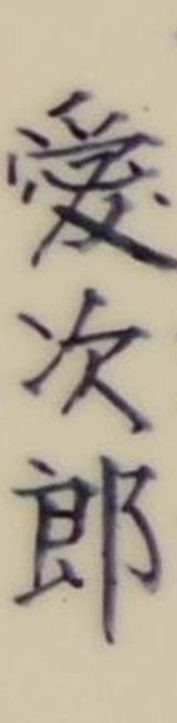愛次郎

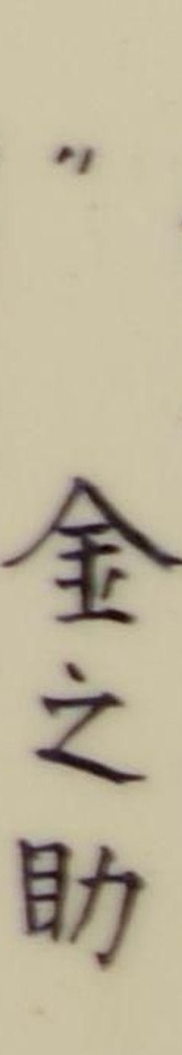金之助
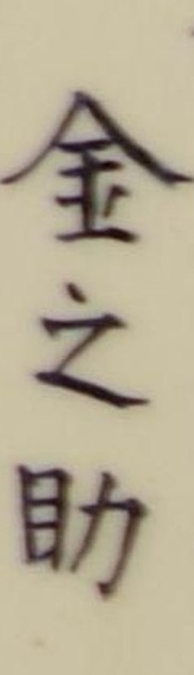金之助
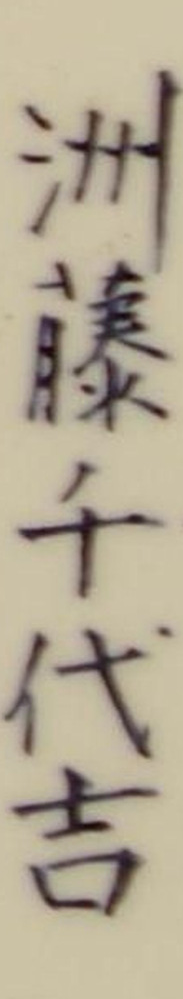洲藤千代吉
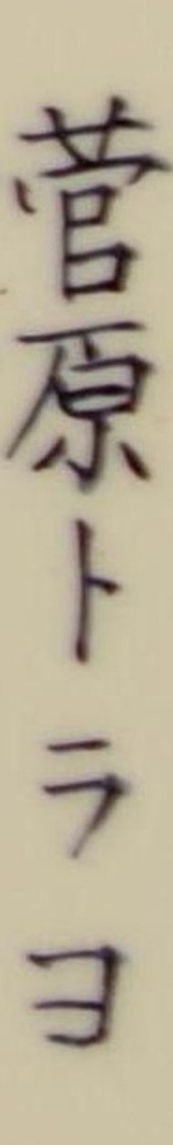菅原トラヨ
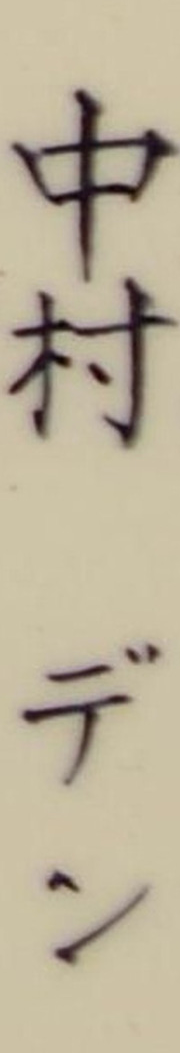中村デン
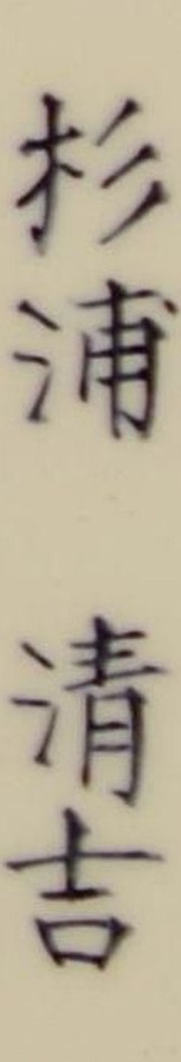杉浦清吉
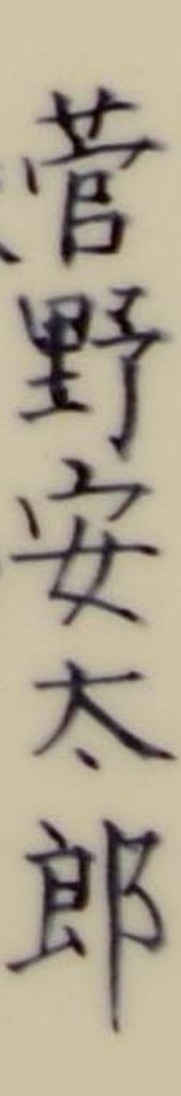菅野安太郎
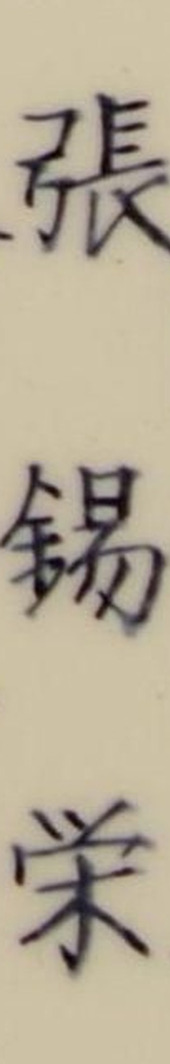張錫栄
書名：E~L
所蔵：高野山金剛峯寺
